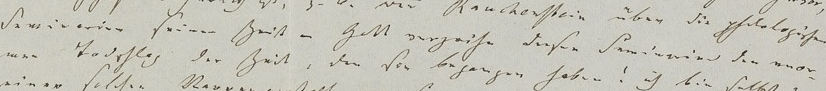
Seminarien seiner Zeit – Gott verzeihe diesen Seminarien den enor-
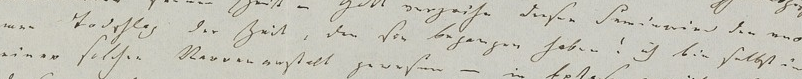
men Todschlag der Zeit, den sie begangen haben! ich bin selbst in
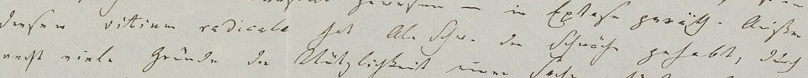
diesem vitium radicale hat Alex. Schw. die Schwäche gehabt, durch
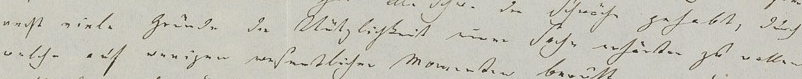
recht viele Gründe die Nützlichkeit einer Sache erhärten zu wollen,
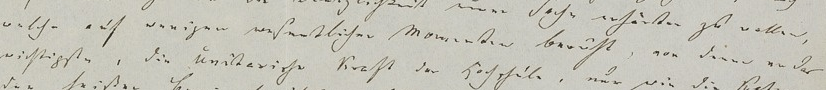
welche auf wenigen wesentlichen Momenten beruht, von denen er das
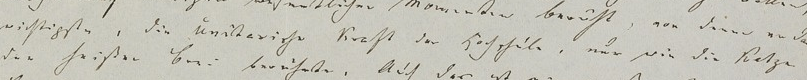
wichtigste, die unitarische Kraft der Hochschule, nur wie die Katze
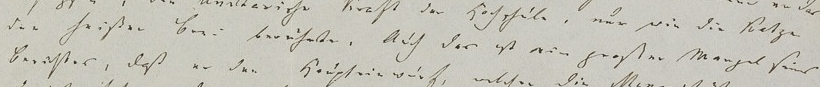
den heißen Brei berührte. Auch das ist ein großer Mangel seines
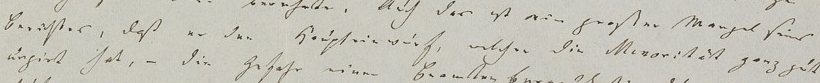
Berichtes, daß er den Haupteinwurf, welchen die Minorität ganz gut
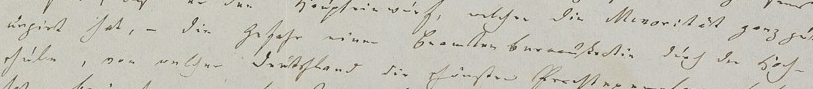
urgirt hat, – die Gefahr einer Beamtenbureaukratie durch die Hoch-
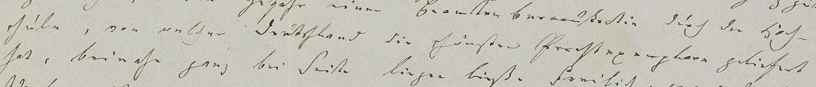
schule, von welcher Deutschland die schönsten Prachtexemplare geliefert
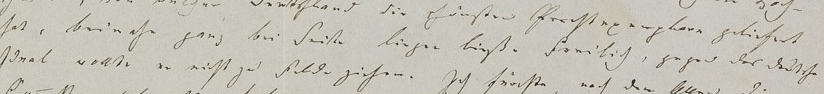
hat, beinahe ganz bei Seite liegen liess. Freilich, gegen das deutsche
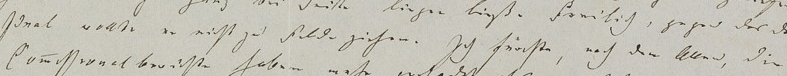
Ideal wollt er nicht zu Felde ziehen. Ich fürchte, nach dem Allem, die
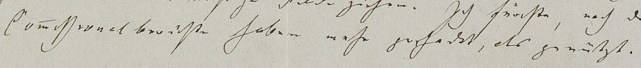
Commissionalberichte haben mehr geschadet, als genützt.
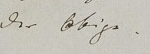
Der Obige.
